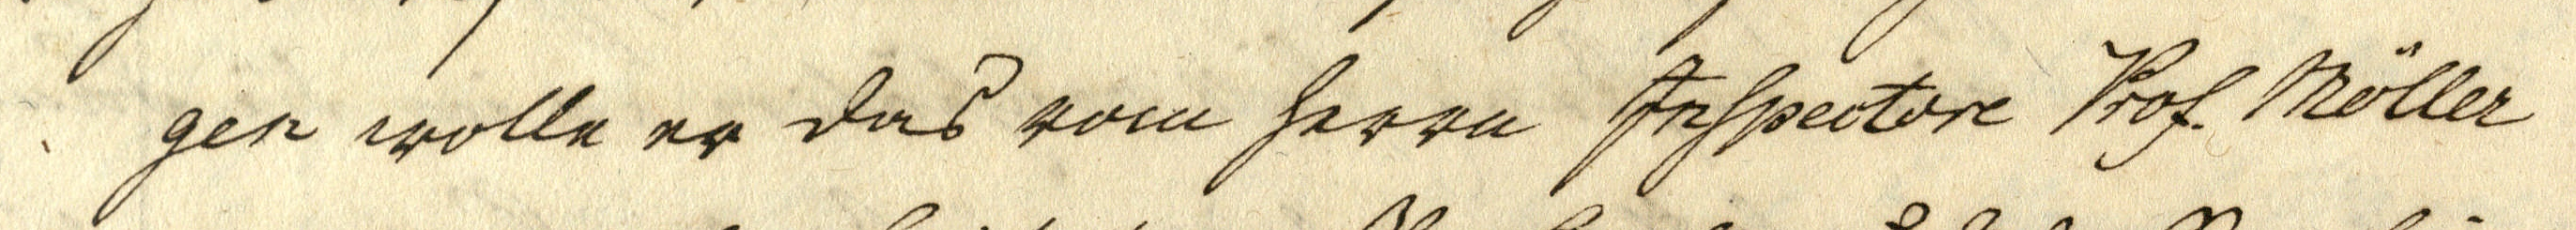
gen wolle er das vom Herrn Insprectore Prof. Möller
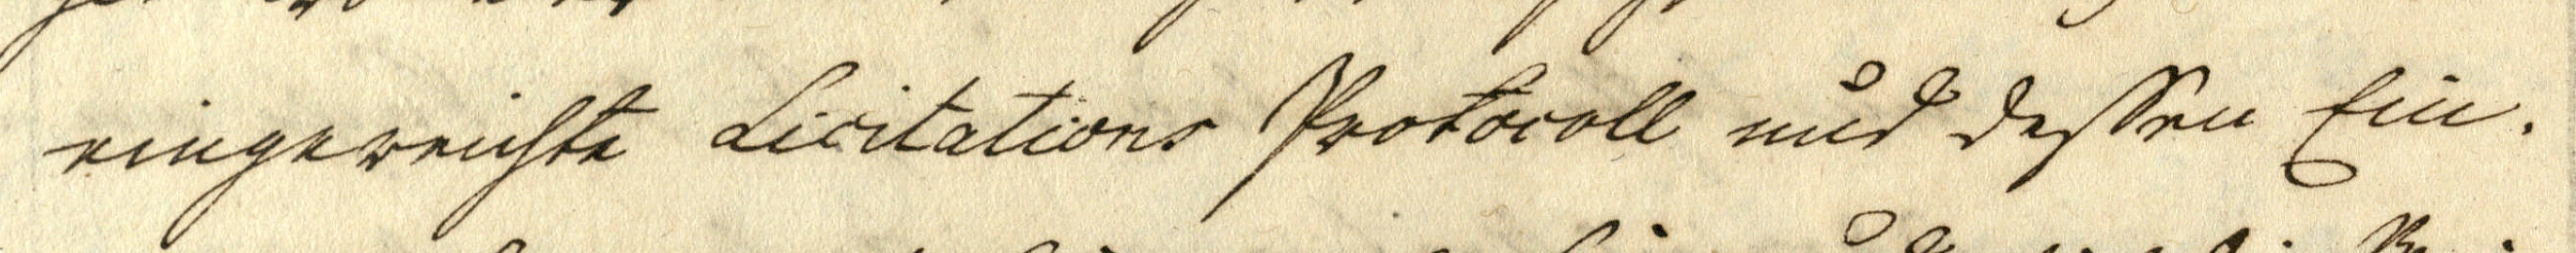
eingereichte Licitations Protocoll und dessen Ein-
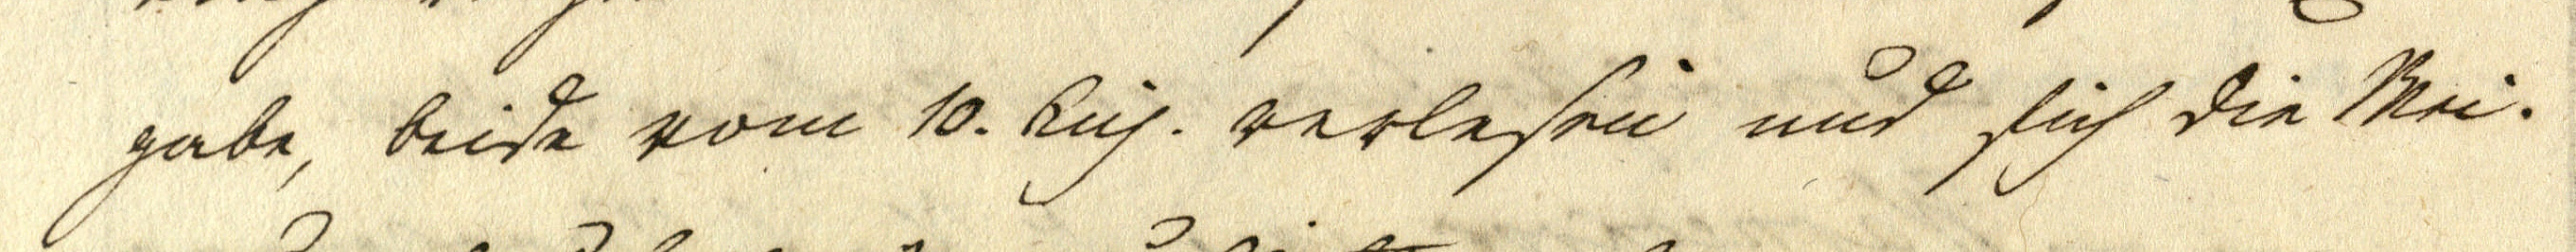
gabe, beide vom 10. huius verlesen und sich die Mein-
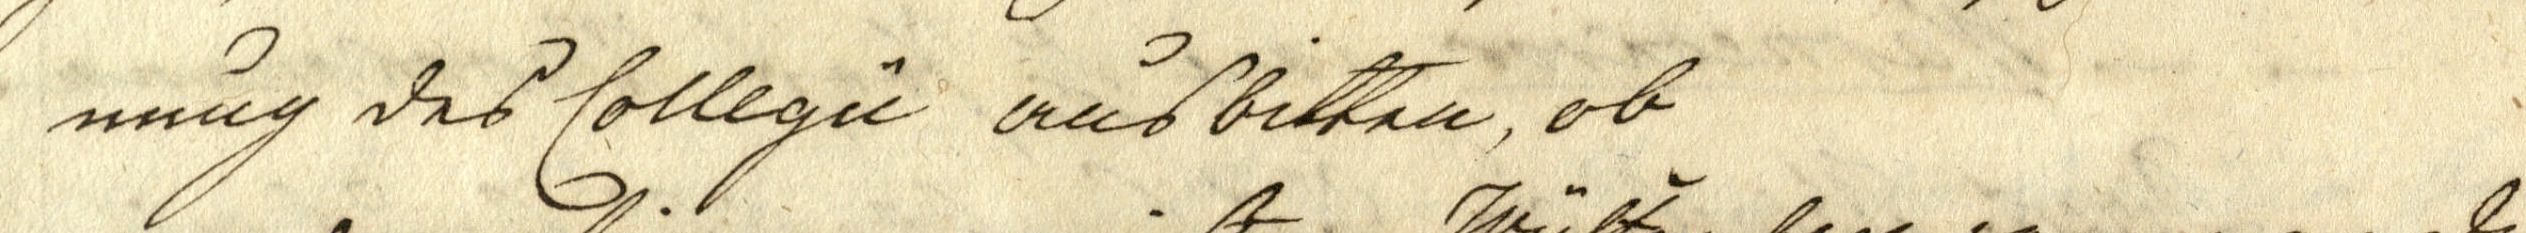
nung des Collegii ausbitten, ob
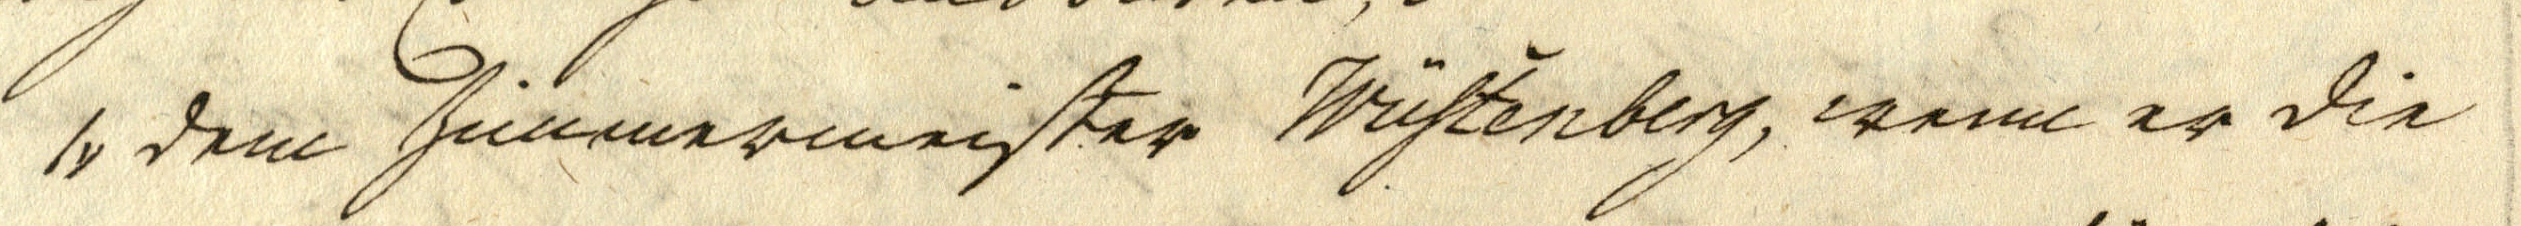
1. dem Zimmermeister Wüstenberg, wenn er die
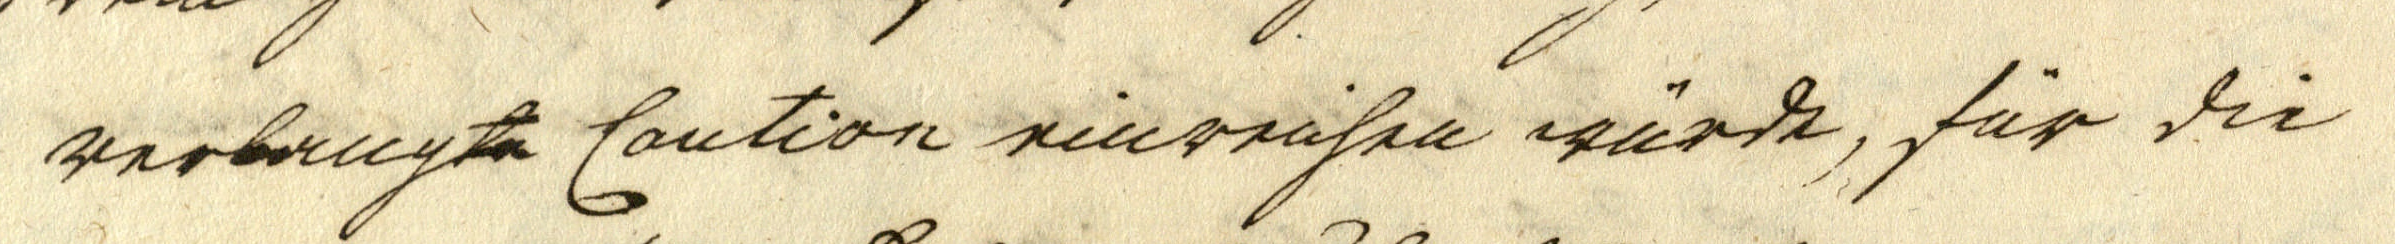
verlangte Caution einreichen würde, für die
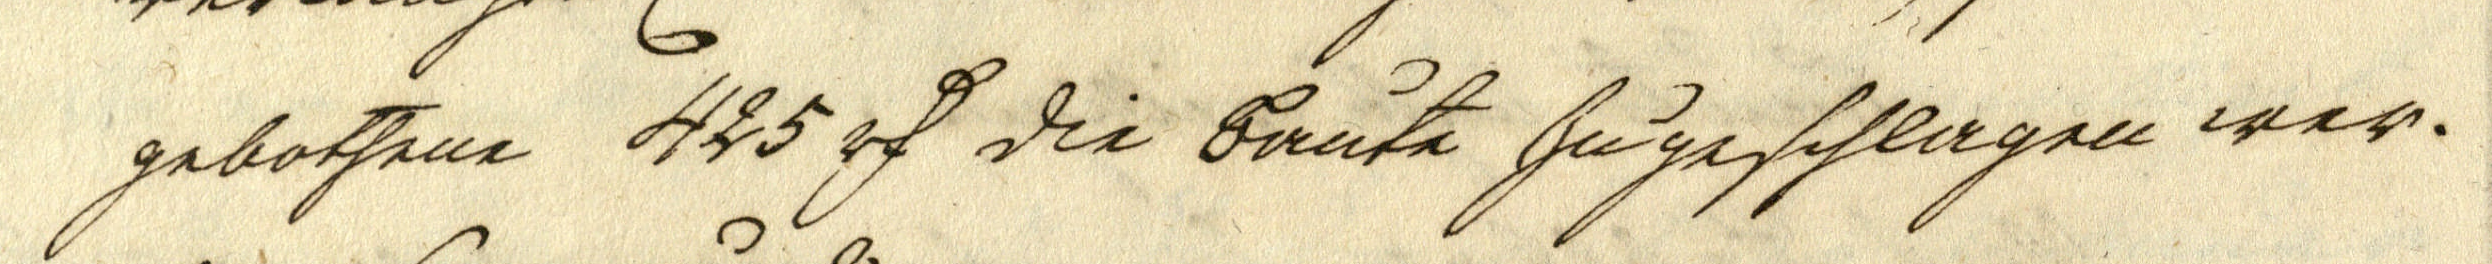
gebothene 425 rth die Baute zugeschlagen wer-
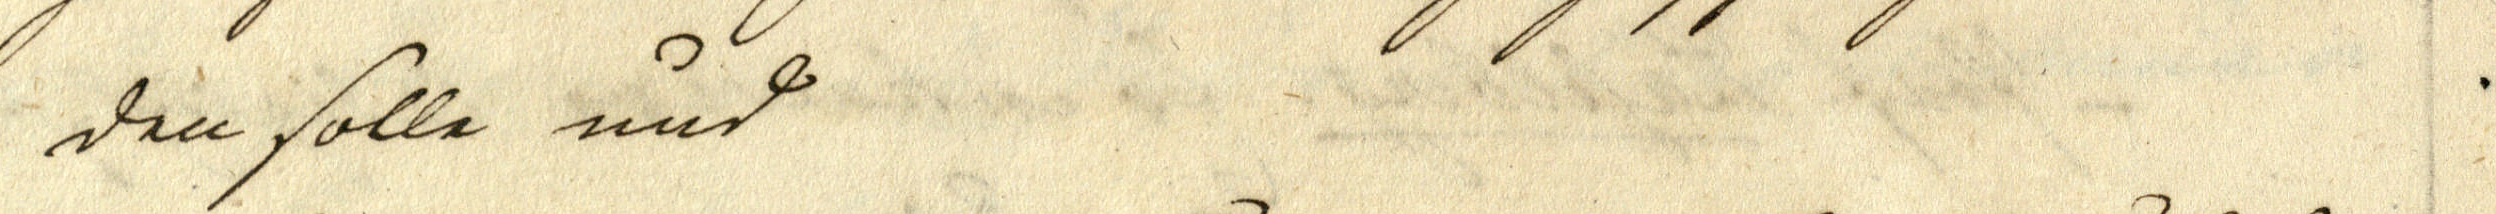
den solle und
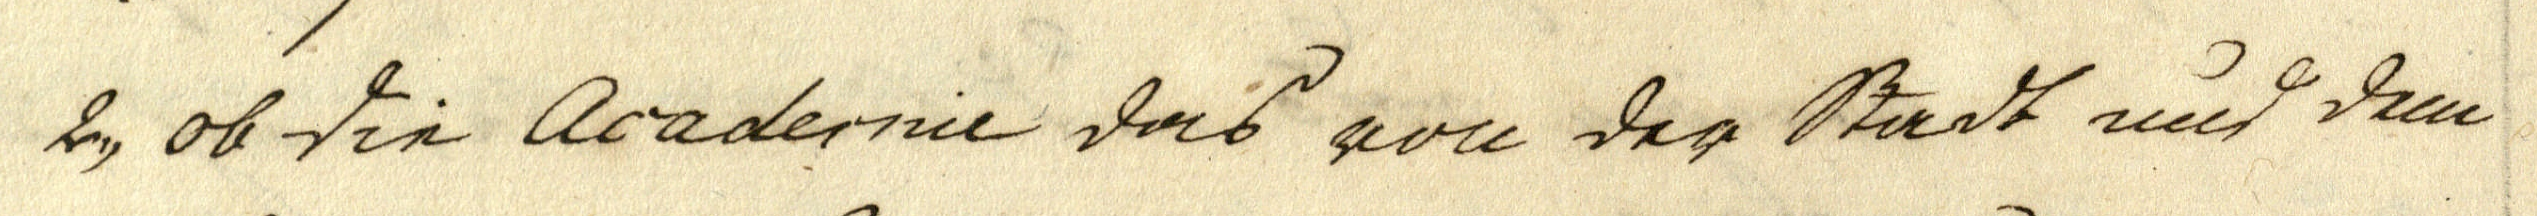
2. ob die Academie das von der Stadt und dem
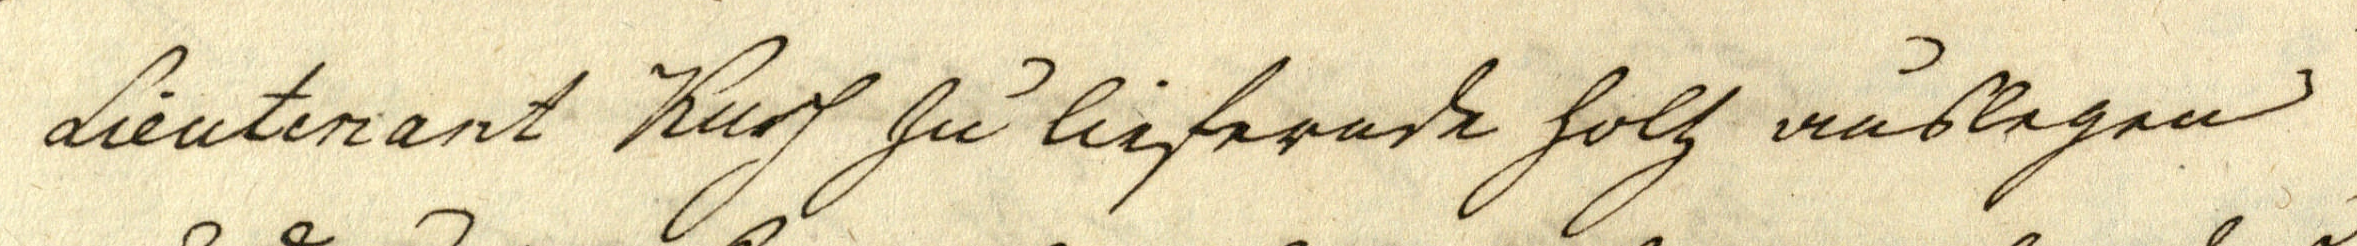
Lieutenant Kuss zu liefernde Holtz auslegen
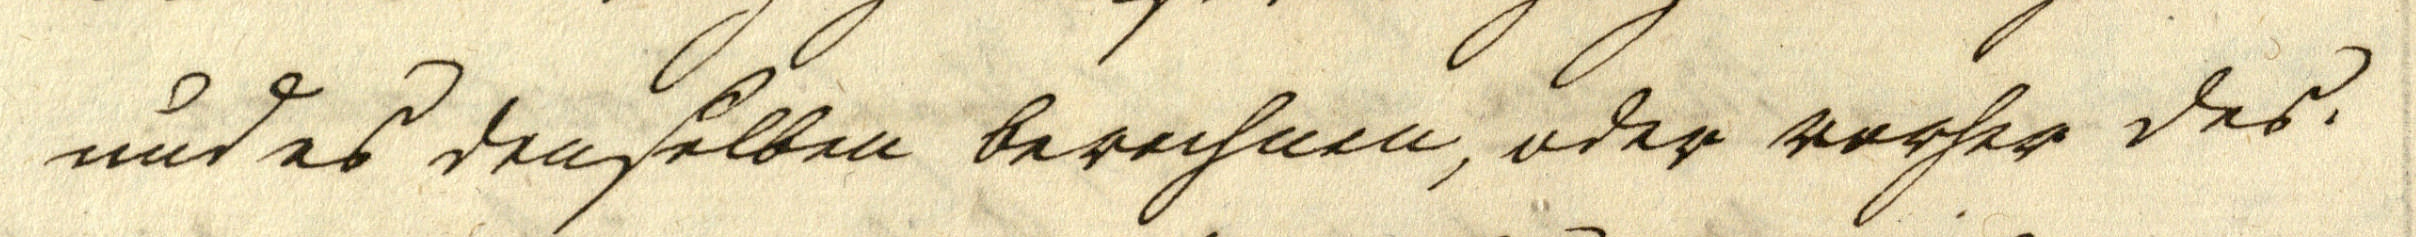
und es denselben berechnen, oder worher des-
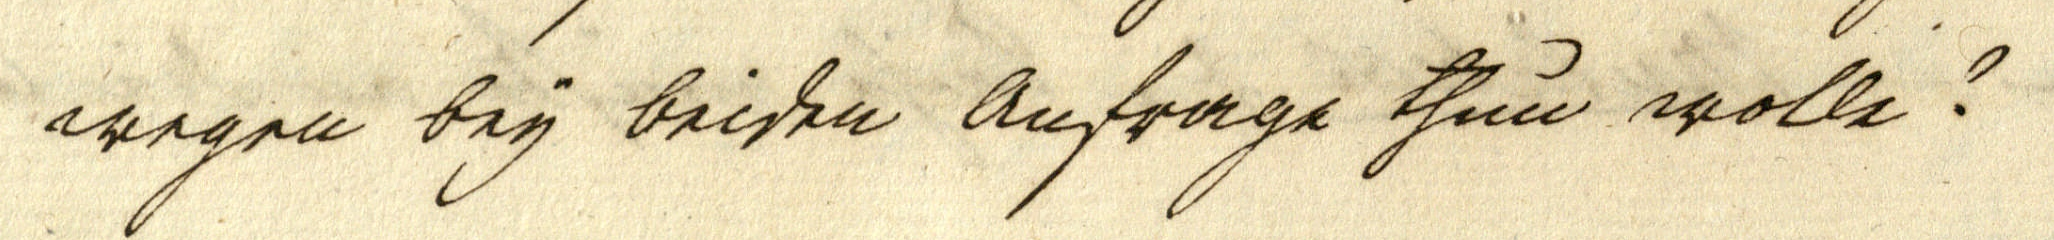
wegen bey beiden Anfrage thun wolle?
